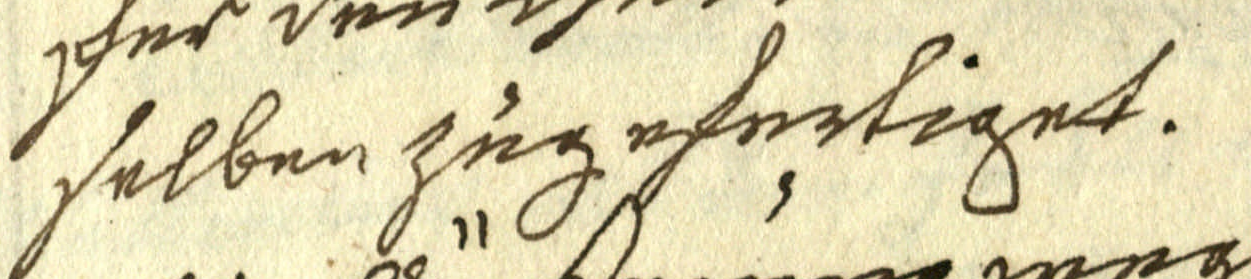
selben zugefertiget.
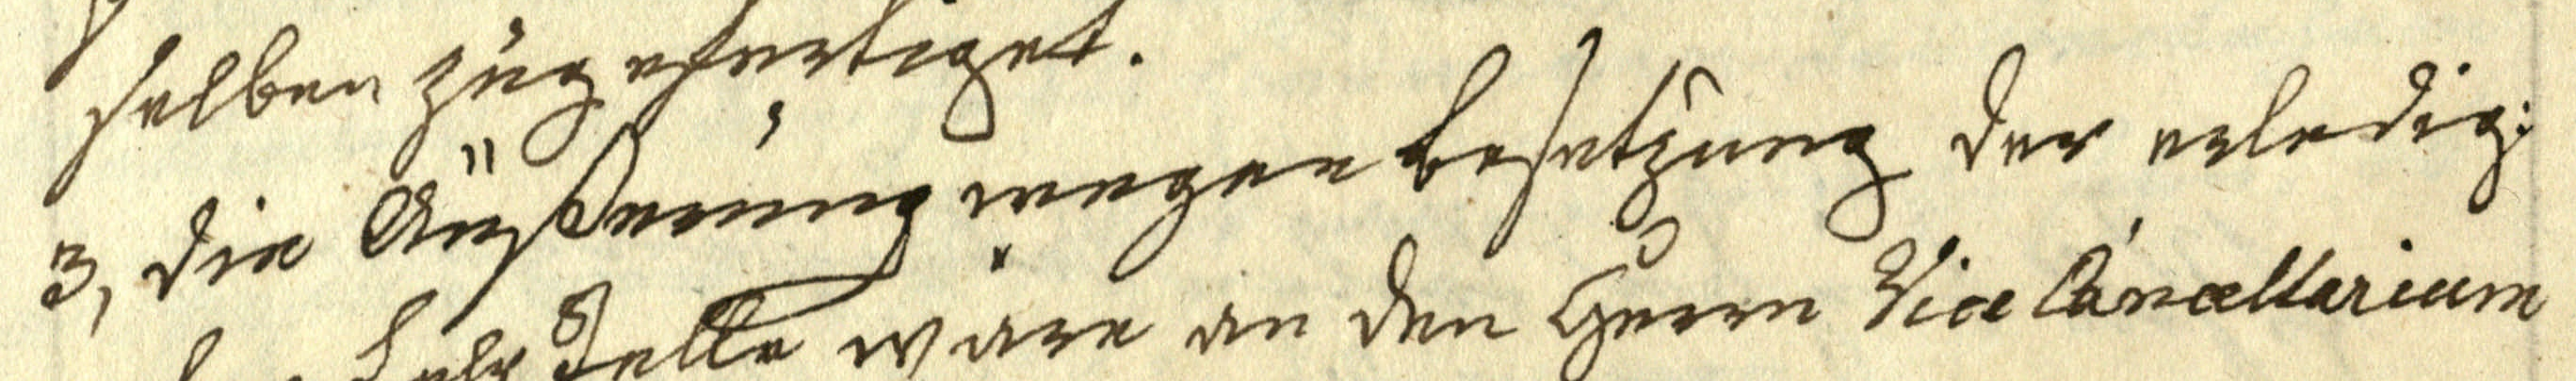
3, die Äußerung wegen Besetzung der erledig¬
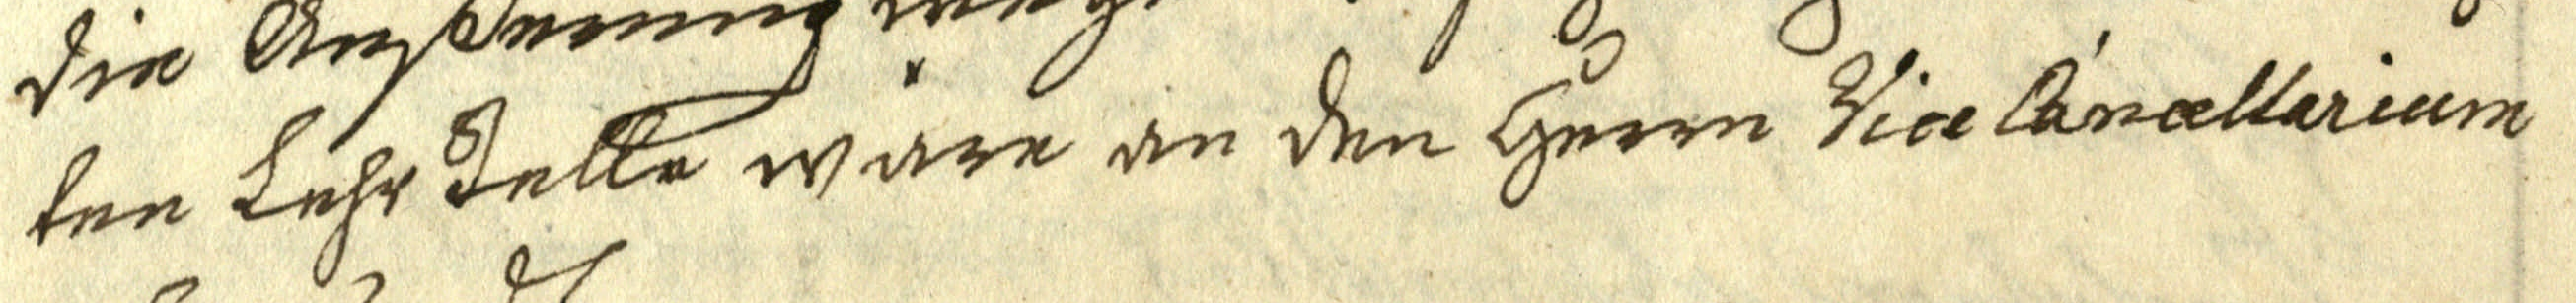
ten Lehrstelle wäre an den Herrn die Cancellarium
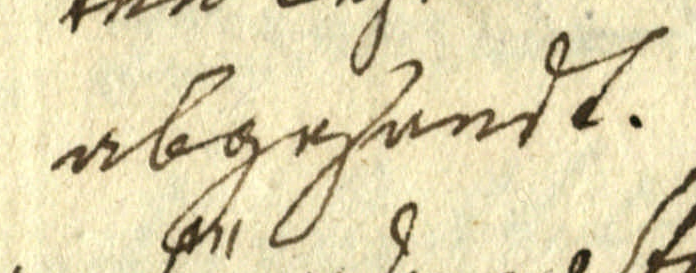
abgesandt.
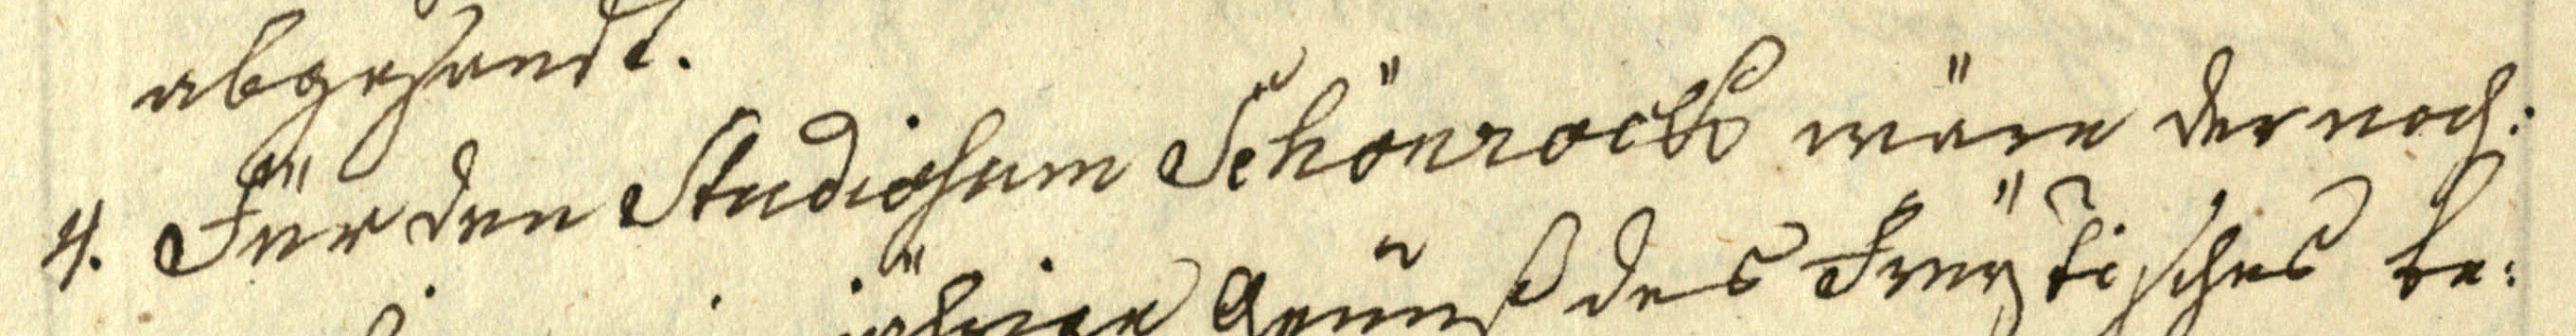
4. Für den Studiosum Schönrock wäre der noch¬
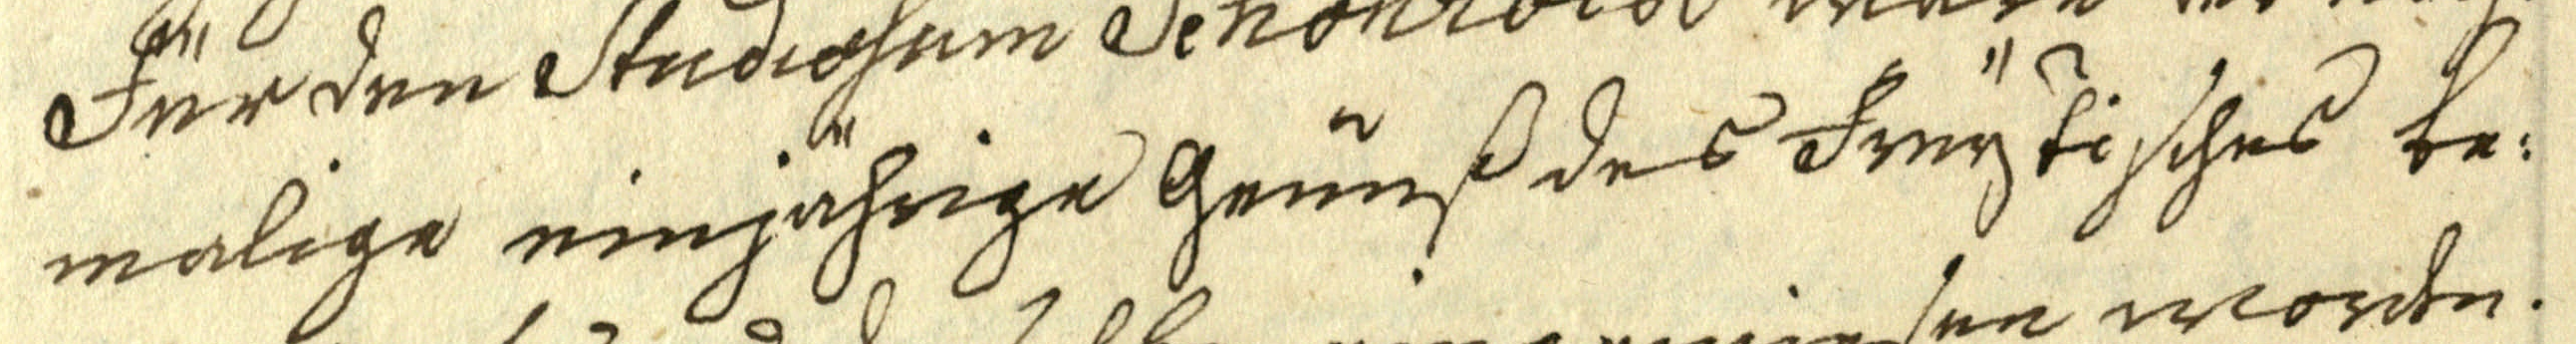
malige einjährige Genuß das Freÿtisches be¬
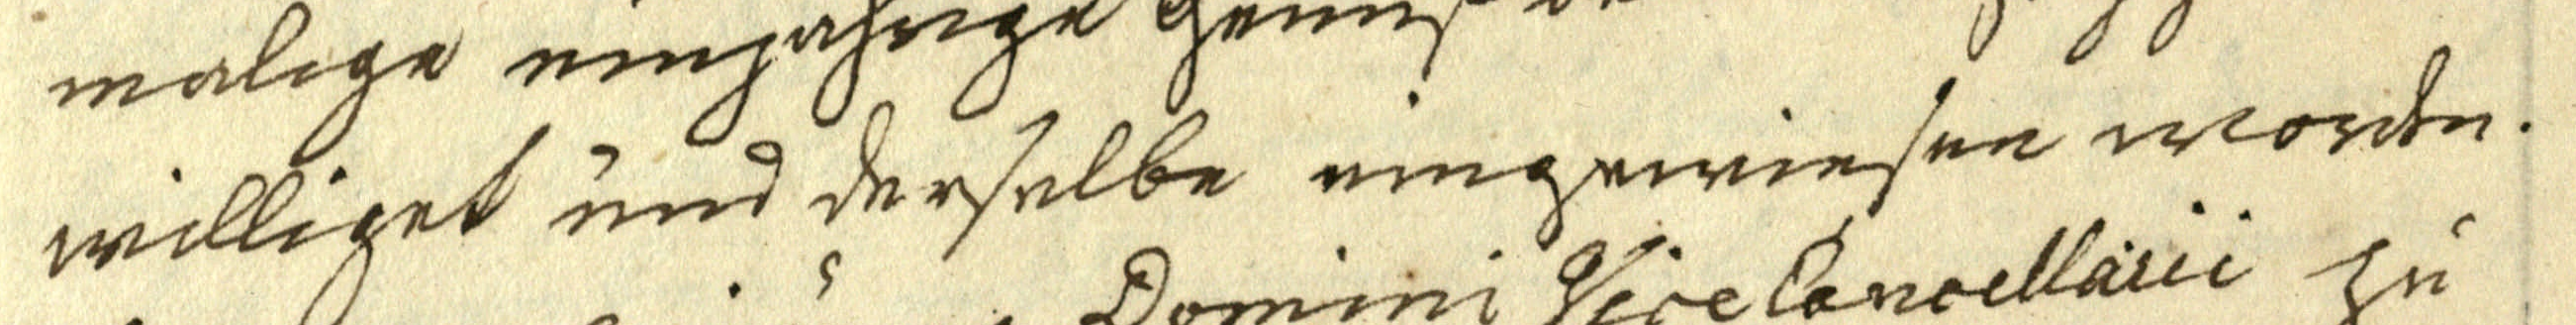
williget und derselbe eingewiesen worden.
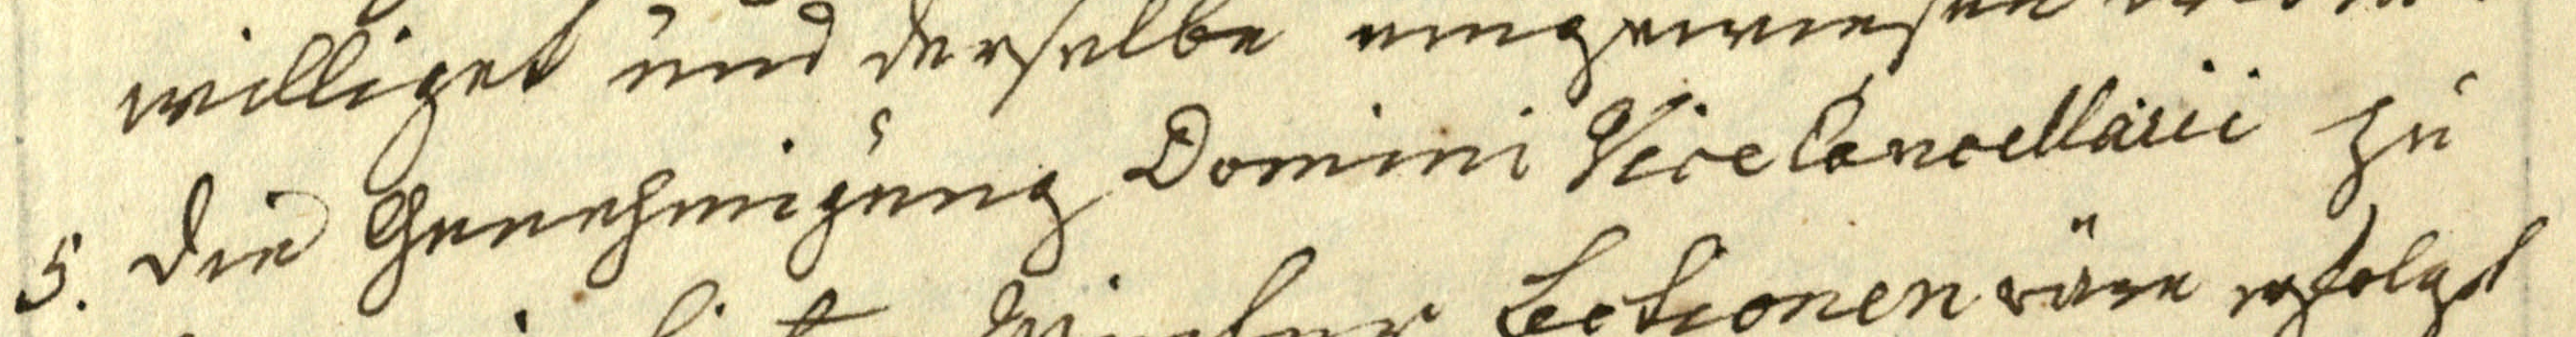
5. die Genehmigung Domini ViceCancellarii zu
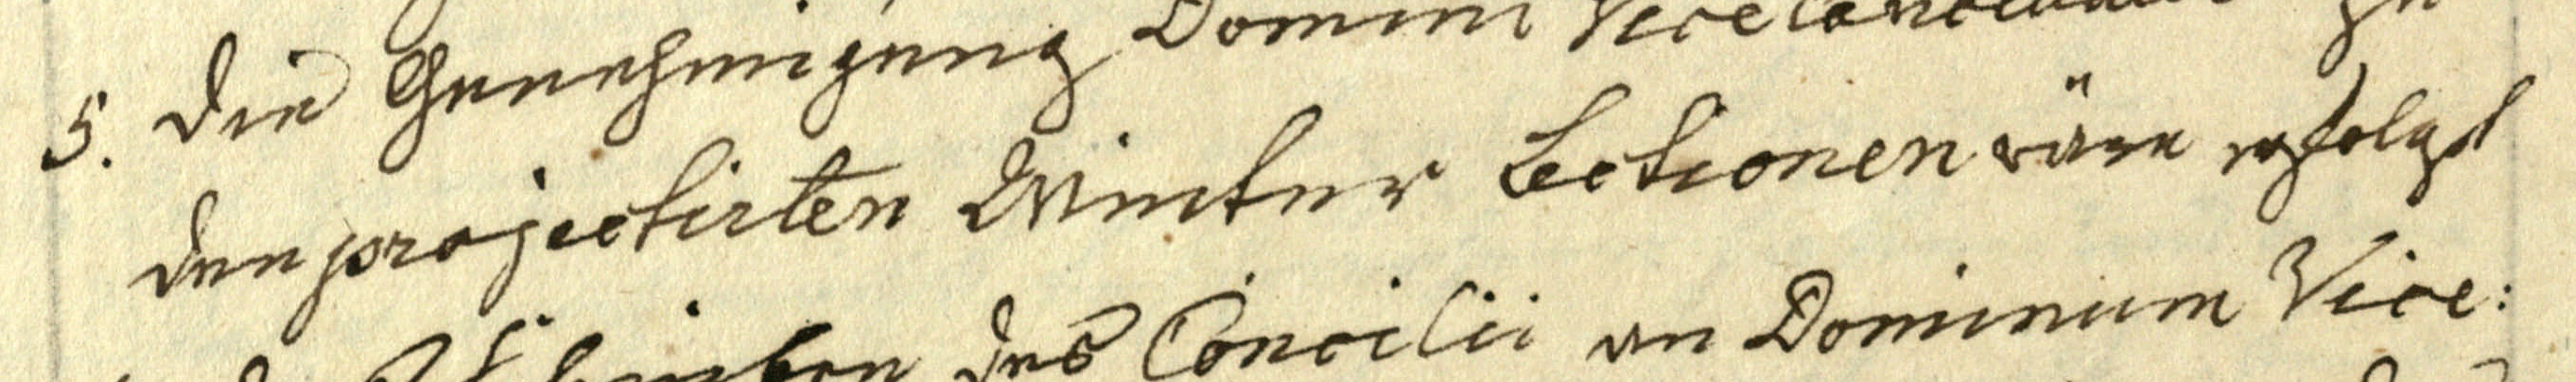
den projectirten Winter Lectionen wäre erfolgt
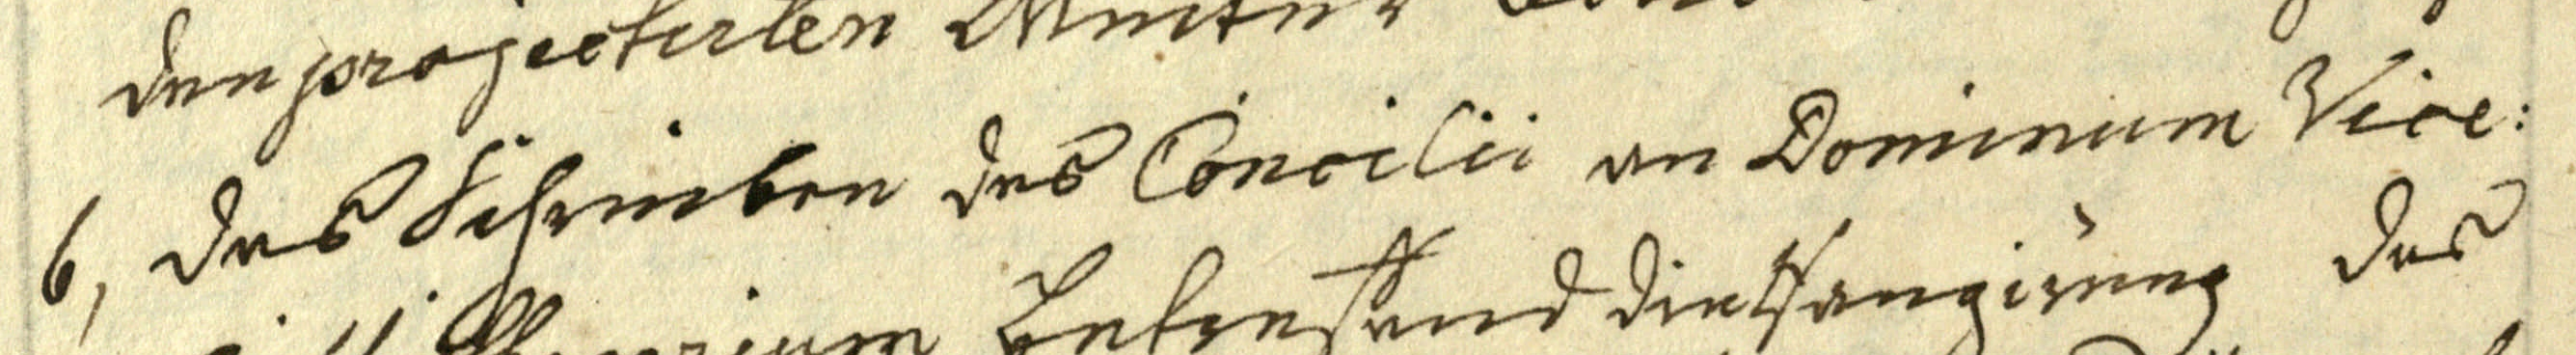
6, das Schreiben des Concilii an Dominum Vice¬
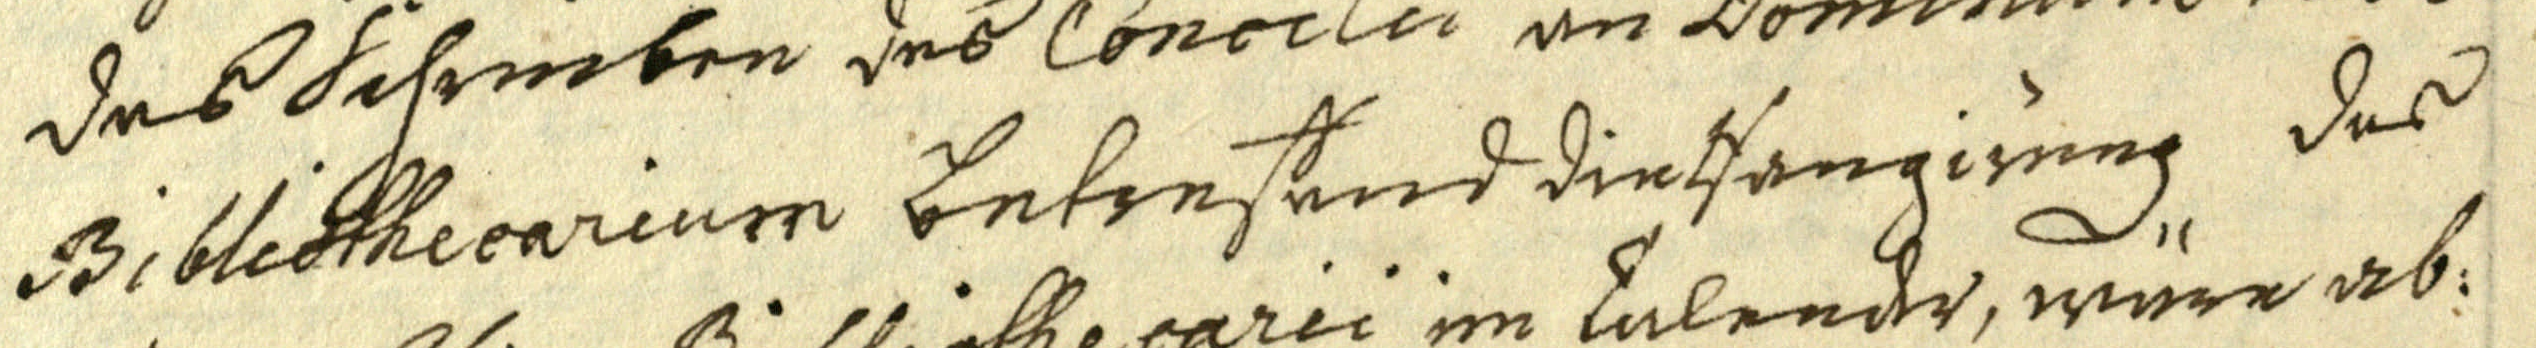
Bibliothecarium betreffend die Rangirung des
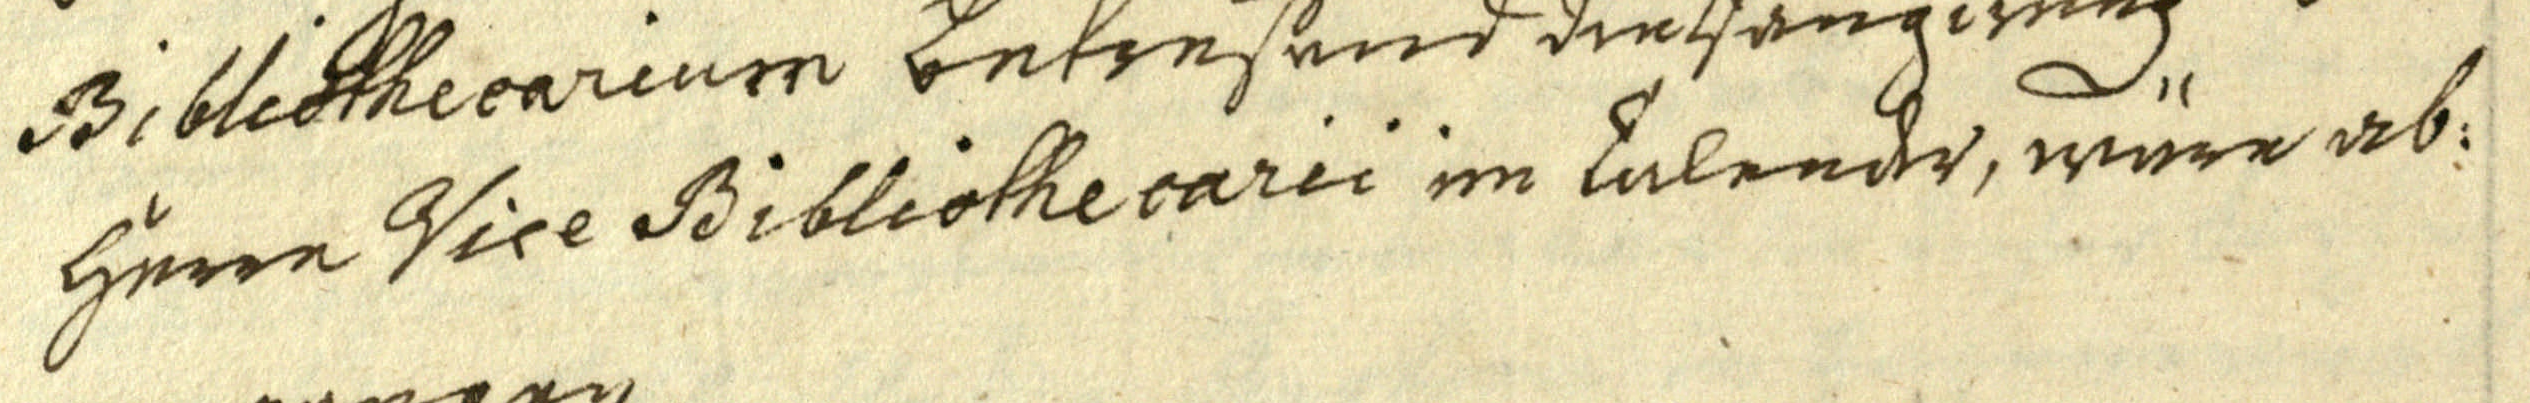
Herrn Vice Bibliothecarii im Calender, wäre ab¬
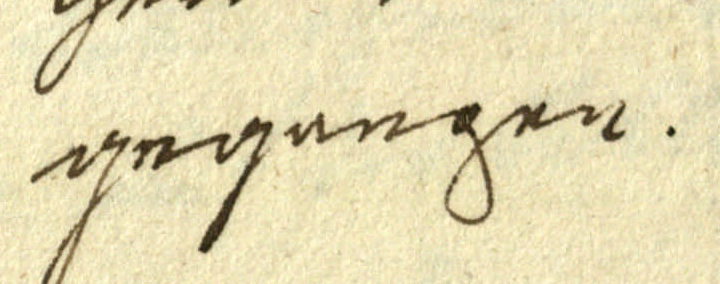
gegangen.
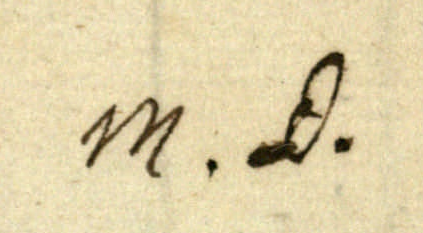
M. D.
